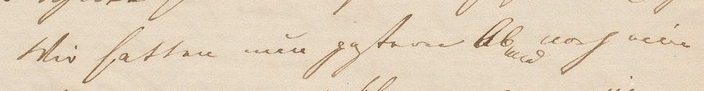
Wir hatten nun gestern Abend noch eine
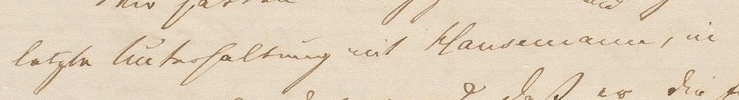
letzte Unterhaltung mit Hansemann, in
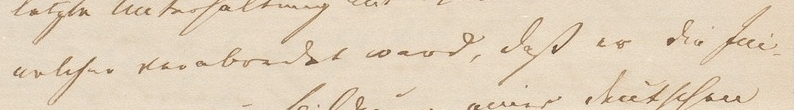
welcher verabredet ward, daß er die Ini-
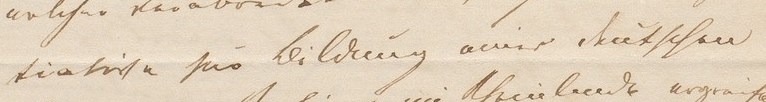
tiative für Bildung eines deutschen
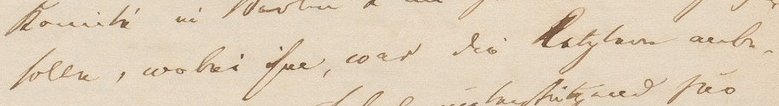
solle, wobei ihm, was die letztern anbe-
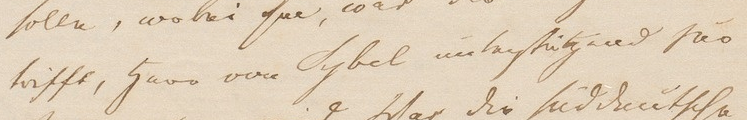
trifft, Herr von Sybel unterstützend zur
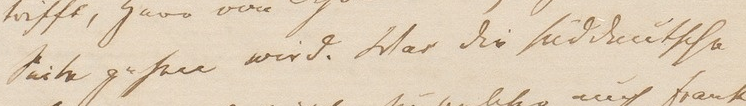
Seite gehen wird. Was die süddeutsche
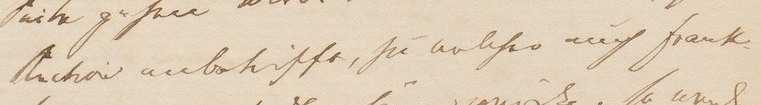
Section anbetrifft, zu welcher auch Frank-
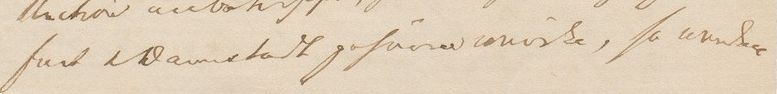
furt & Darmstadt gehören würden, so werden
